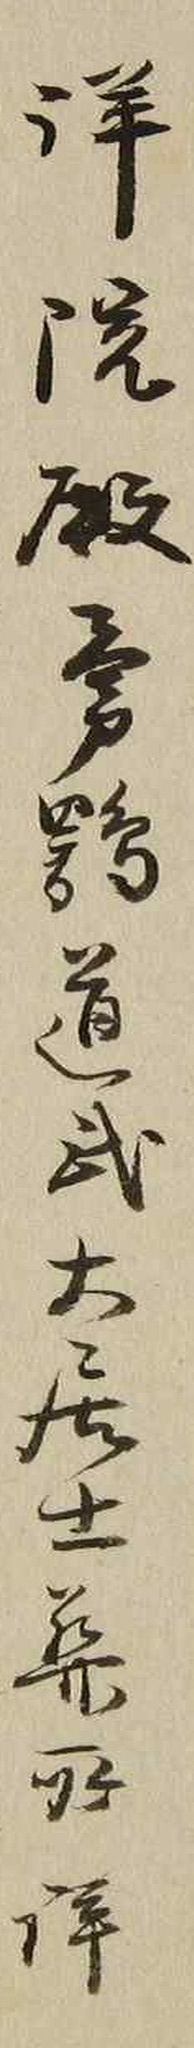詳院殿夢鶚道武大居士葬所詳
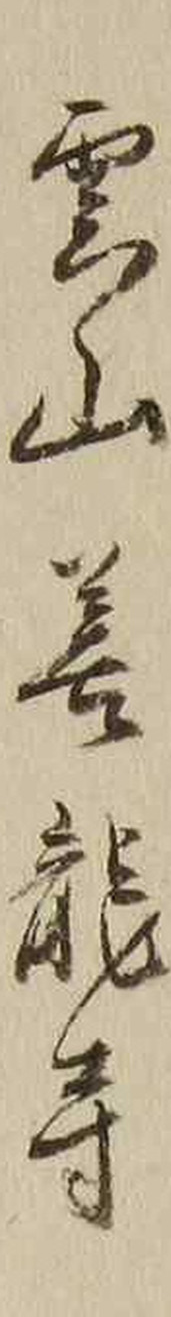雲山善龍寺
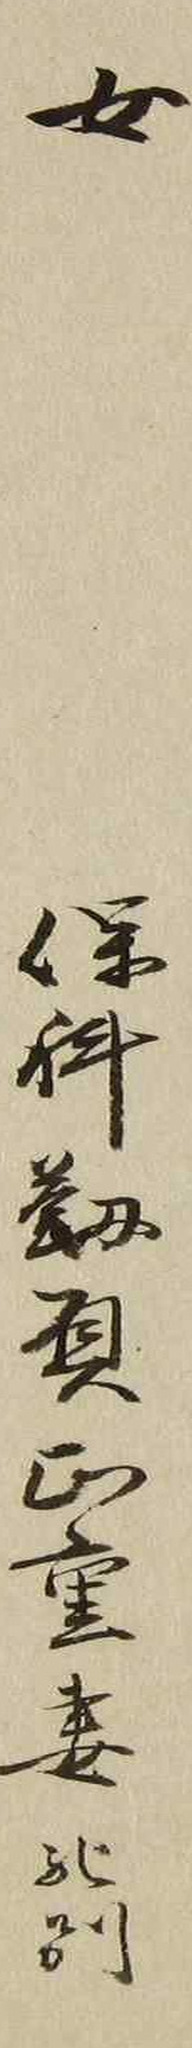女保科靭負正重妻死別
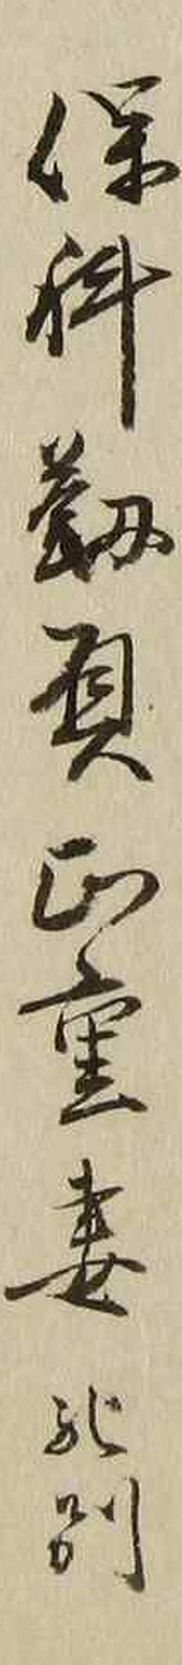女保科靭負正重妻死別
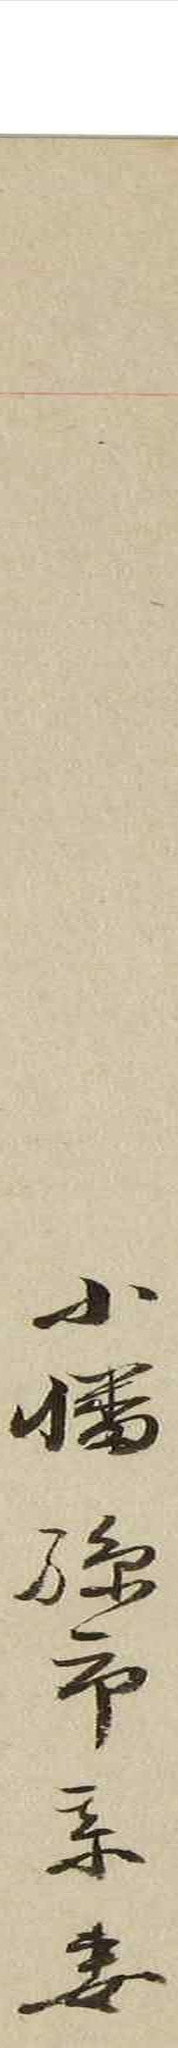小幡孫市系妻
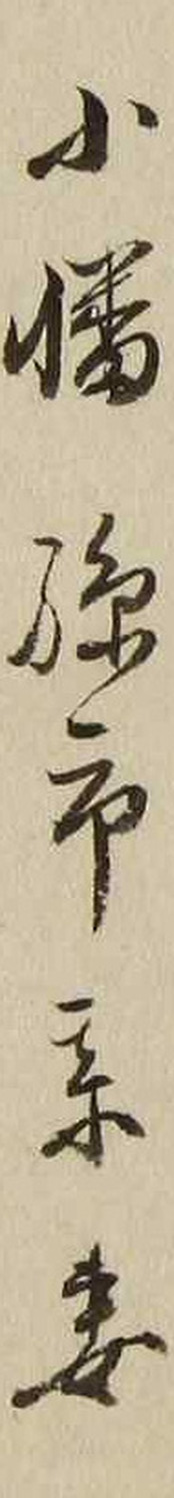小幡孫市系妻

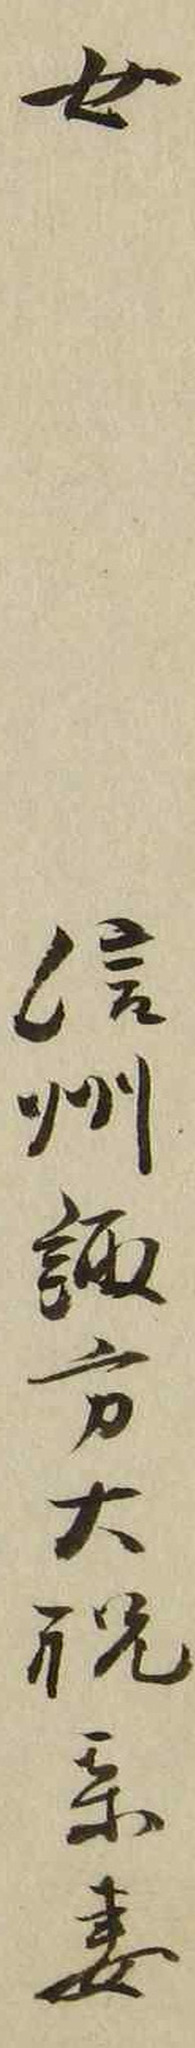女信州諏方大祝系妻
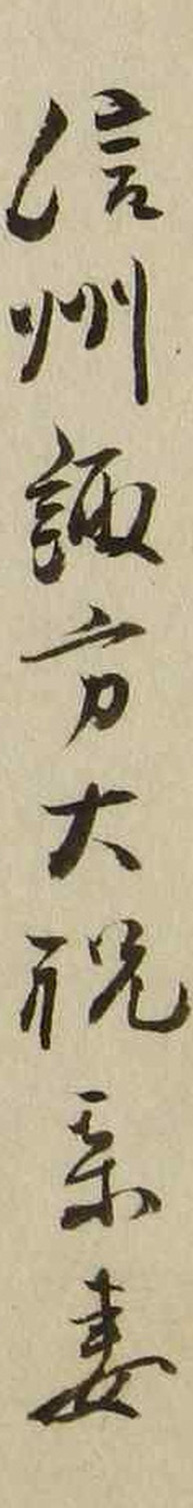女信州諏方大祝系妻
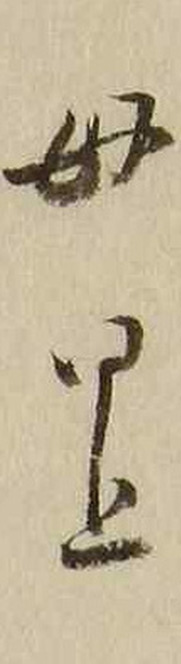母同上
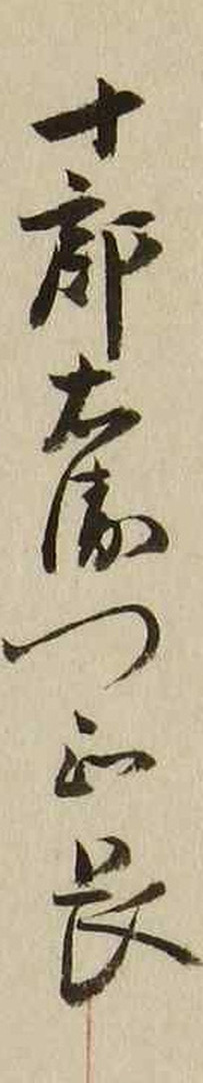十郎右衛門正長
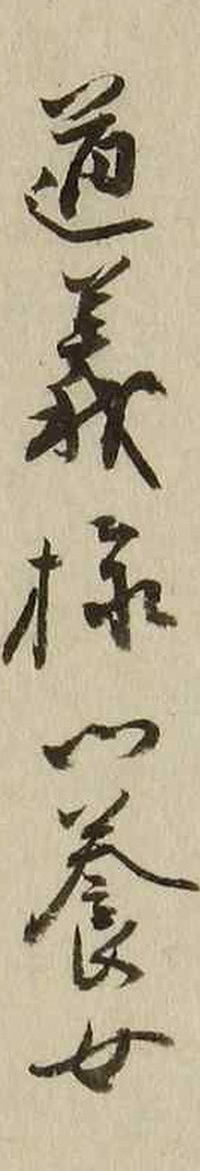道義様御養女
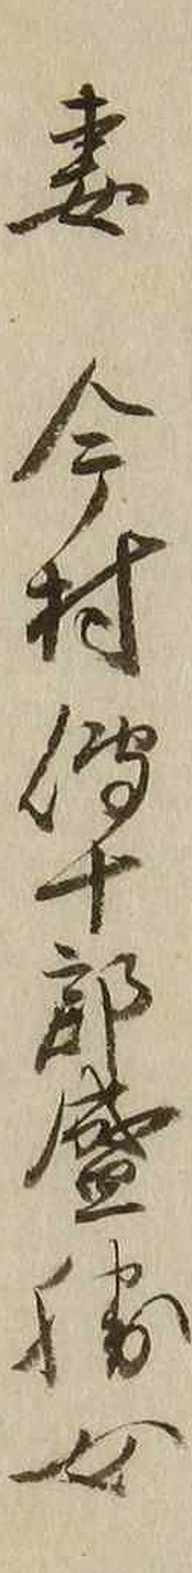妻今村伝十郎盛勝女
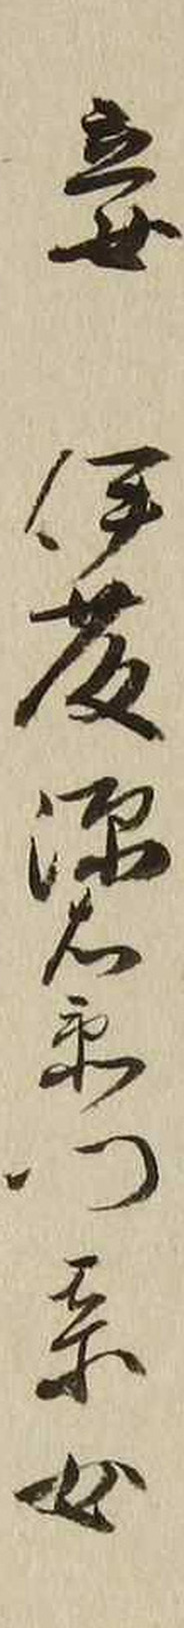妻伊藤源右衛門系女
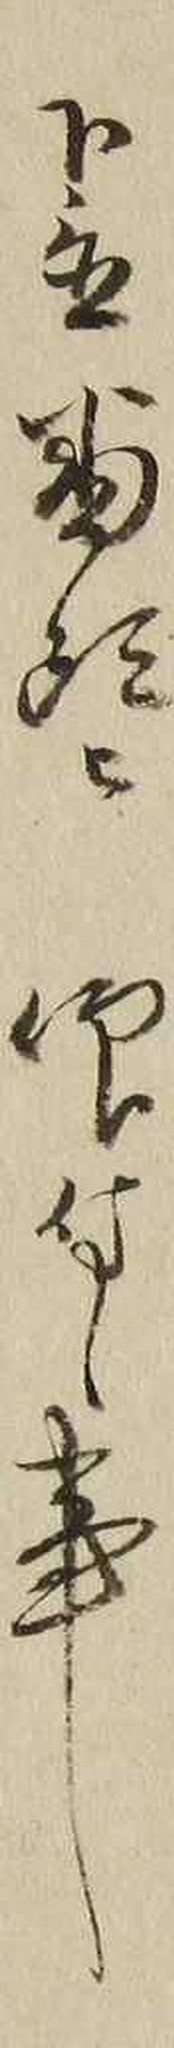下置番頭被仰付候事
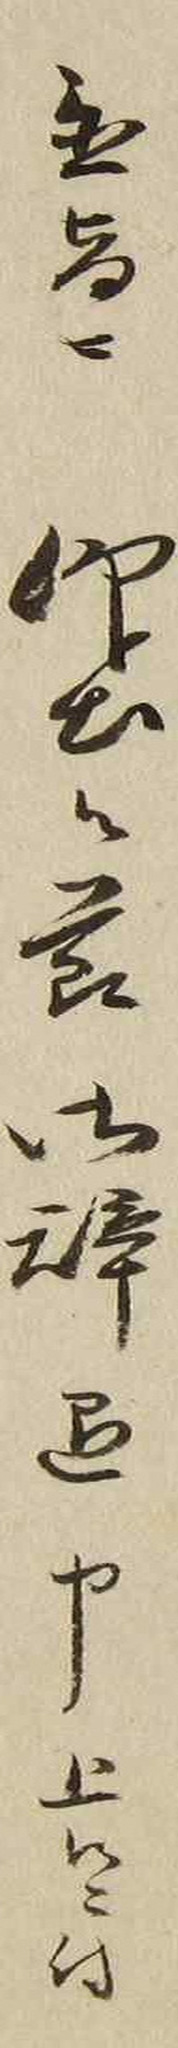置旨被仰出候節御辞退申上候に付
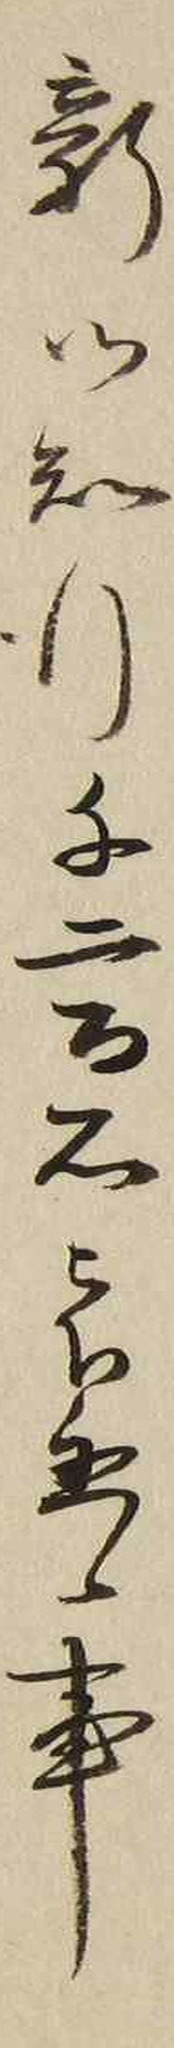新御知行千二百石被下置候事
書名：諸士系譜　巻之269　さ之部1
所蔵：会津若松市立会津図書館
